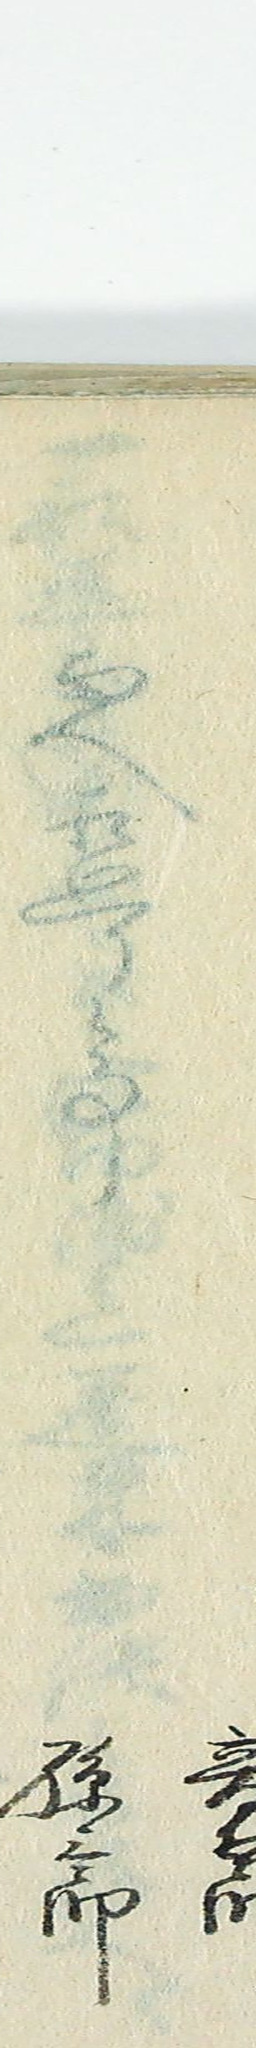孫三郎
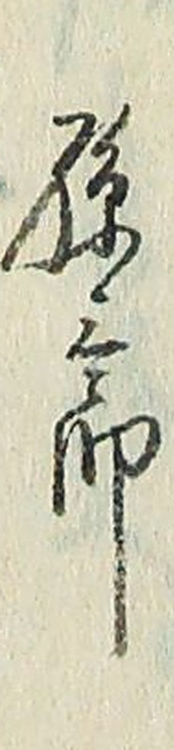孫三郎
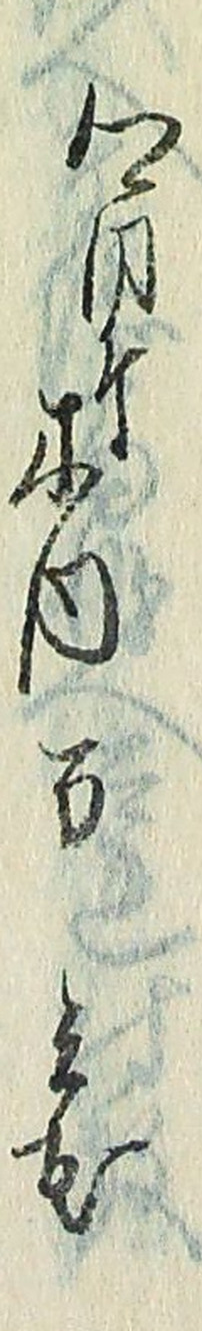木内百兵衛
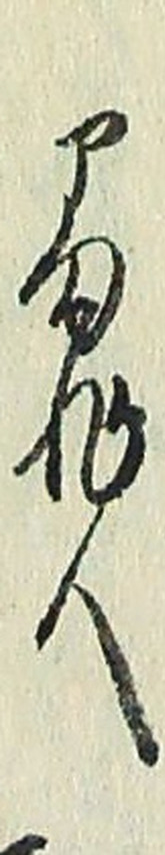番非人
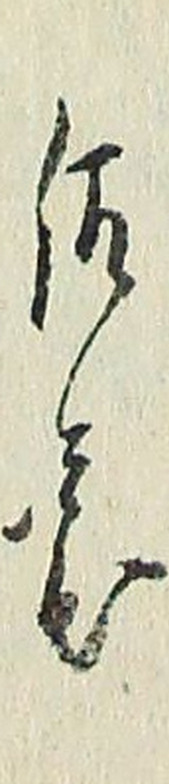佐兵衛
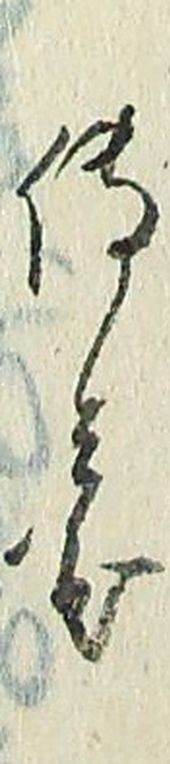佐兵衛
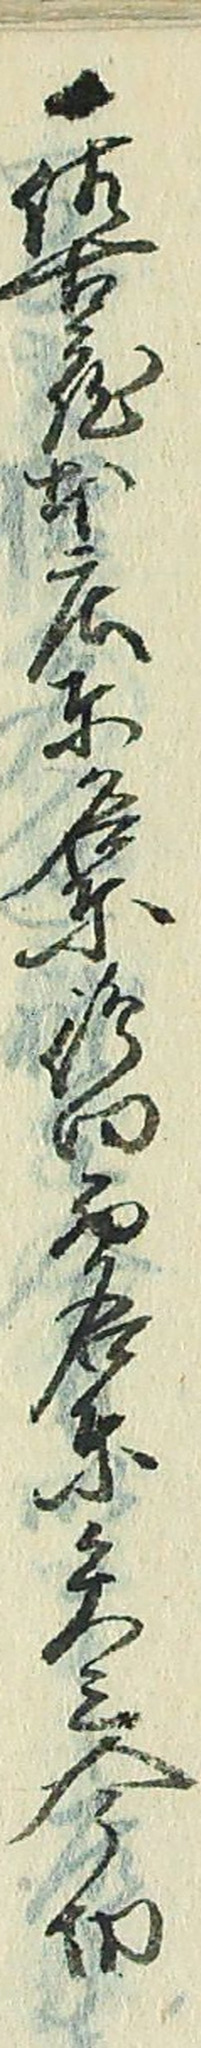一佐古蔵本庄東名東嶋田西名東矢三今切
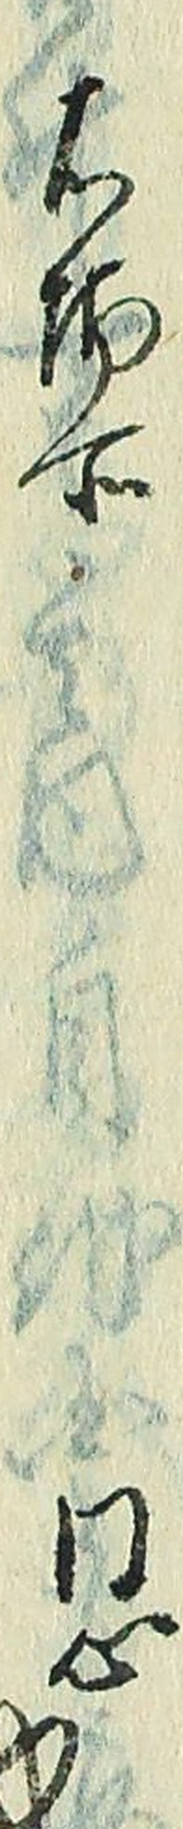右場所同心
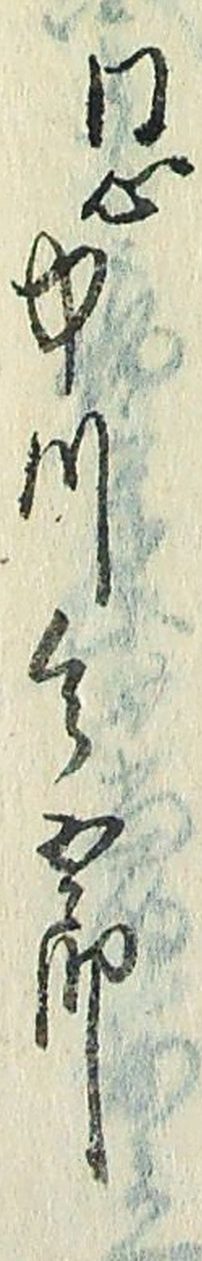中川今五郎
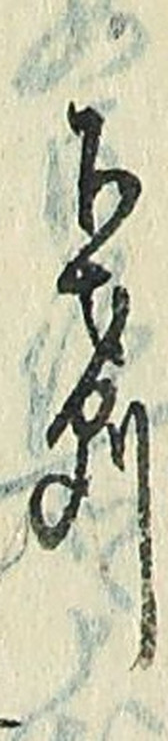下才判
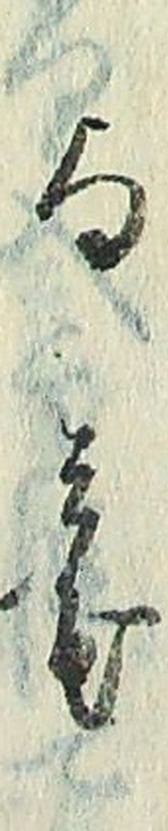与兵衛
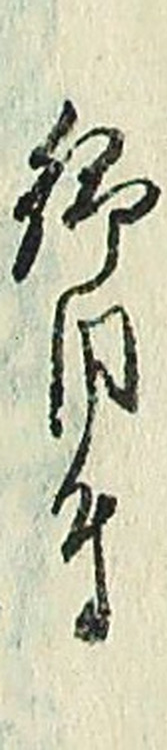郷目付
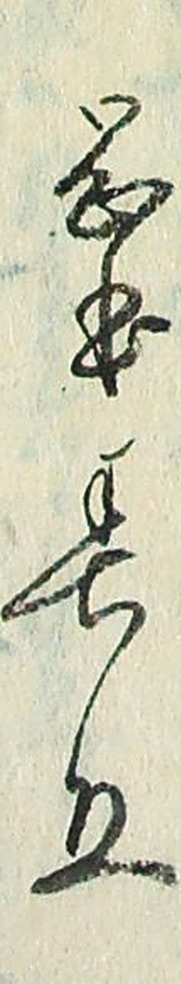岡本春吉

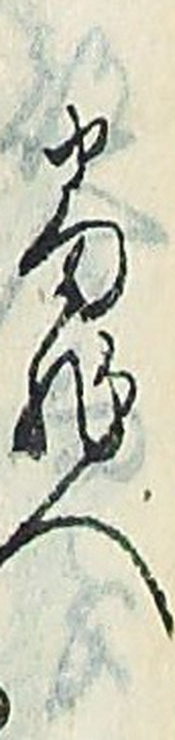番非人
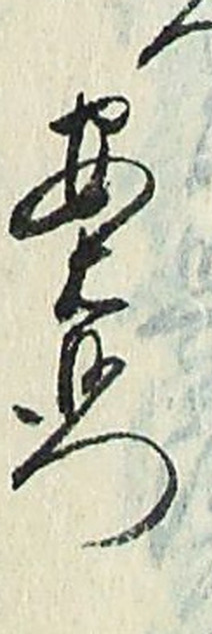安右衛門
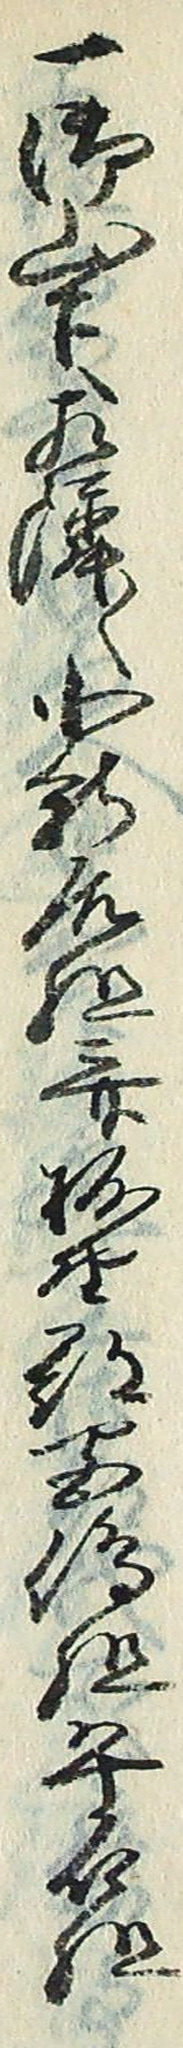一御山下へ相隣候北新居組幷板野郡宮嶋組平石組
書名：諸御趣意書并御下知向之写
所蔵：鳴門教育大学 Naruto University of Education
